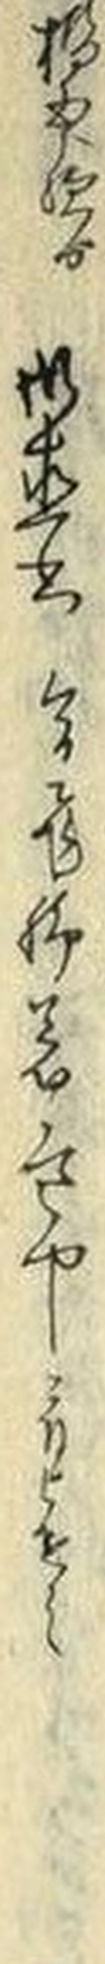楷五郎様ゟ御直書今日飛脚着寒中ニ付被進之
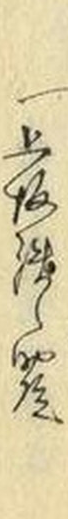上坂鉄之助殿
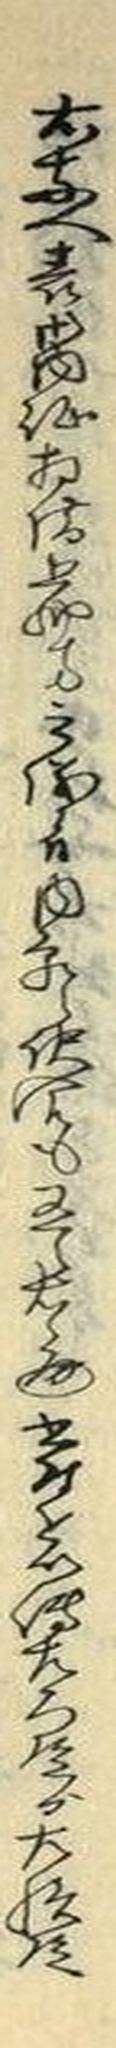右両人表御内証拝借上納方之儀ニ付内願之訳合も有之右之通書付を以伝左衛門殿ゟ左膳殿
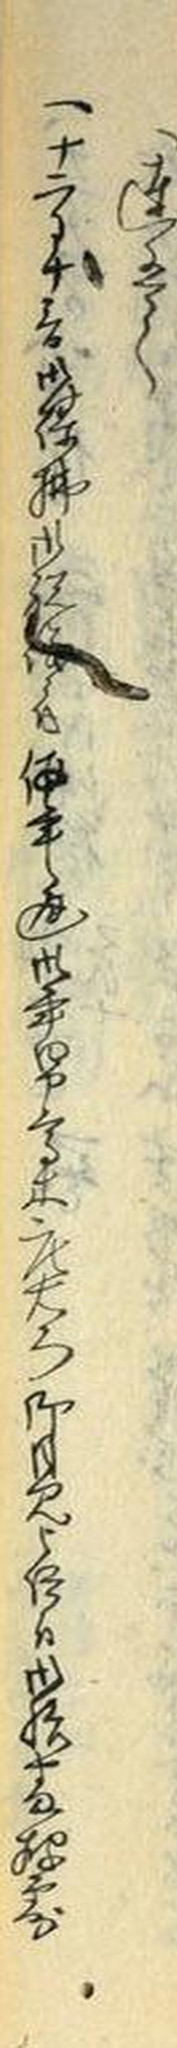一十二月十三日御煤払御祝儀ニ付例年之通御年男高木庄右衛門御目見被仰付御膳番披露
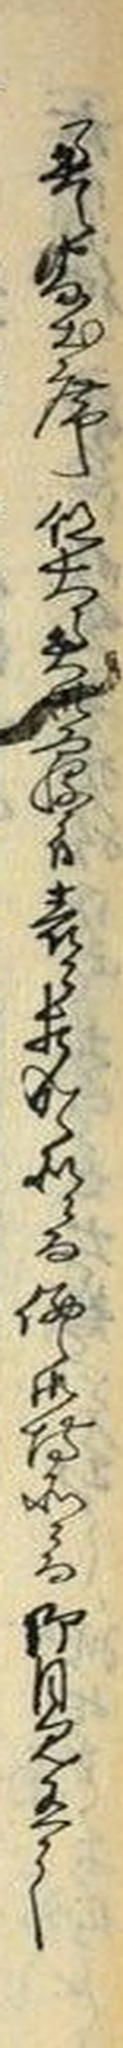奥之番出席但大奥御寝ニ付表ニ相成候処ニ而例之御場所ニ而御目見有之
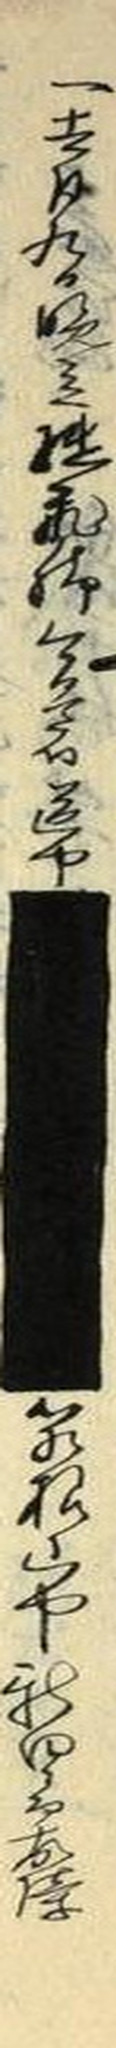一去月九日晩立継飛脚今日着道中箱根山中新田ニ而故障
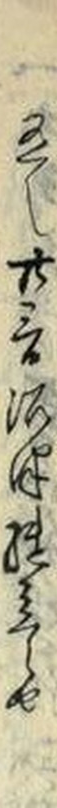有之廿三日沼津継立之由
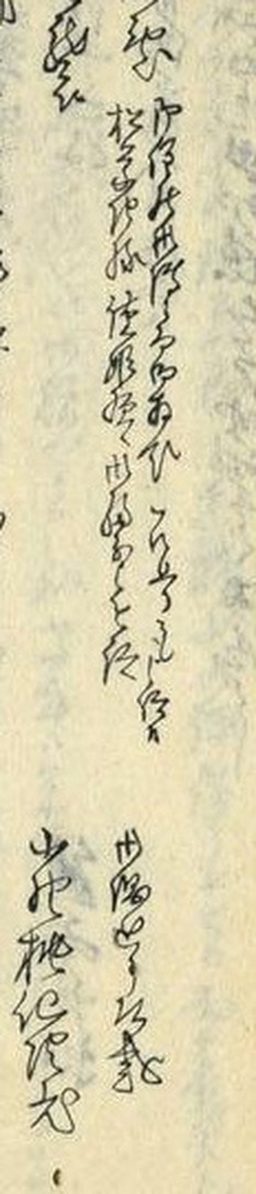松栄院様謹姫様へ御福分被進候跡御側廻り頂戴
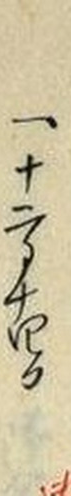一十二月十二日
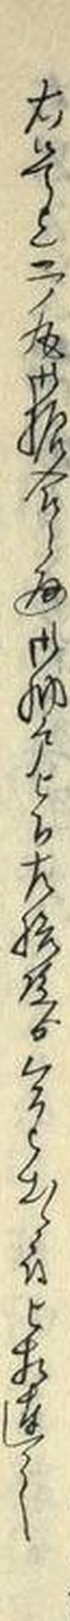右是迄二ノ丸御振合之通御納戸被下左膳殿ゟ今日出候ニ付被相達之
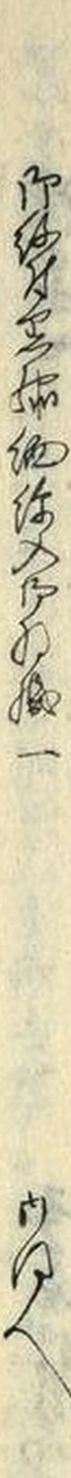御紋付黒縮緬綿入御羽織一御同人
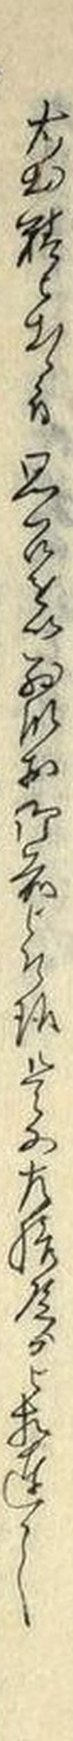右出精被出候ニ付思召を以前段於御前被下候趣是又左膳殿ゟ被相達之
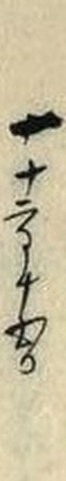一十二月十五日
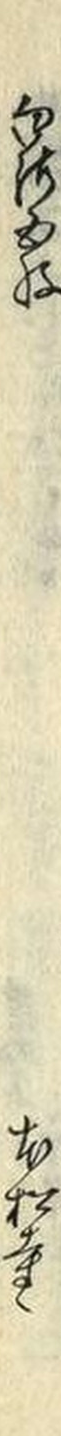白銀五枚本松寺へ
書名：少傅日録抄（斉善付側向頭取日記、在府）
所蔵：福井県文書館 Fukui Prefectural Archives
